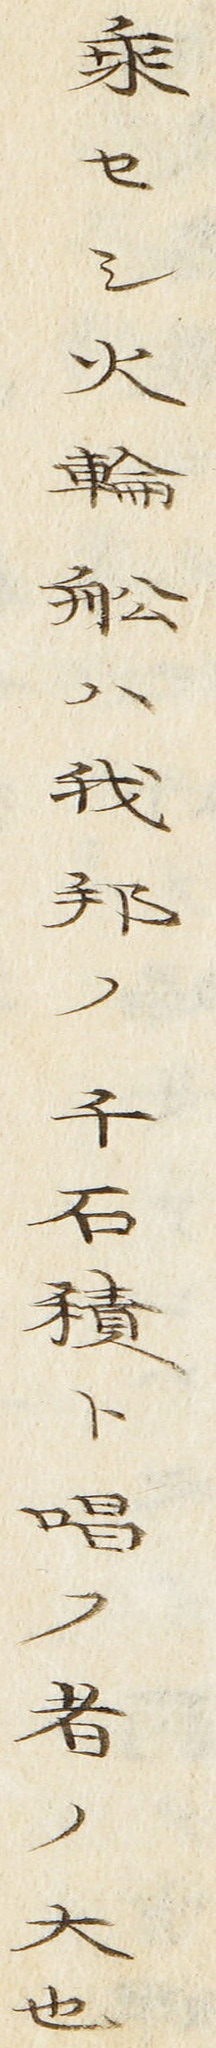〇乗セシ火輪舩ハ我邦ノ千石積ト唱フ者ノ大也
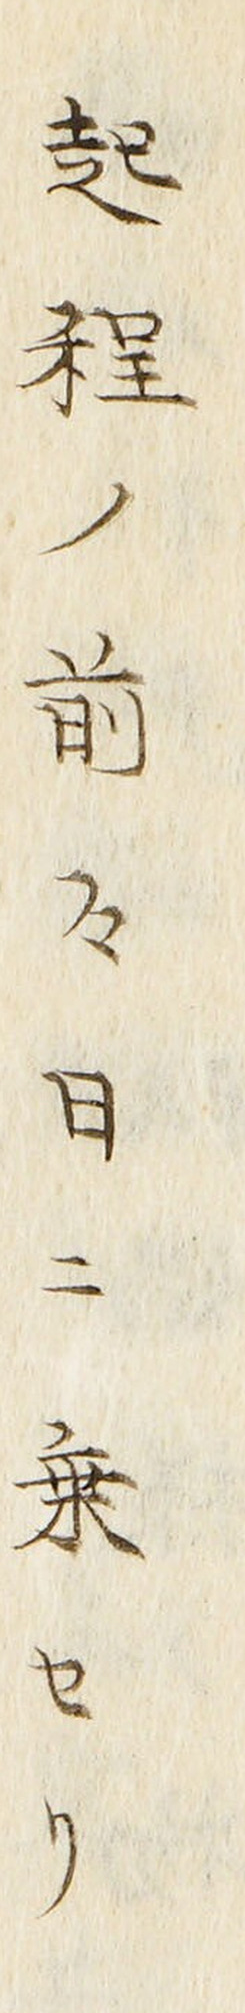起程ノ前々日ニ乗セリ
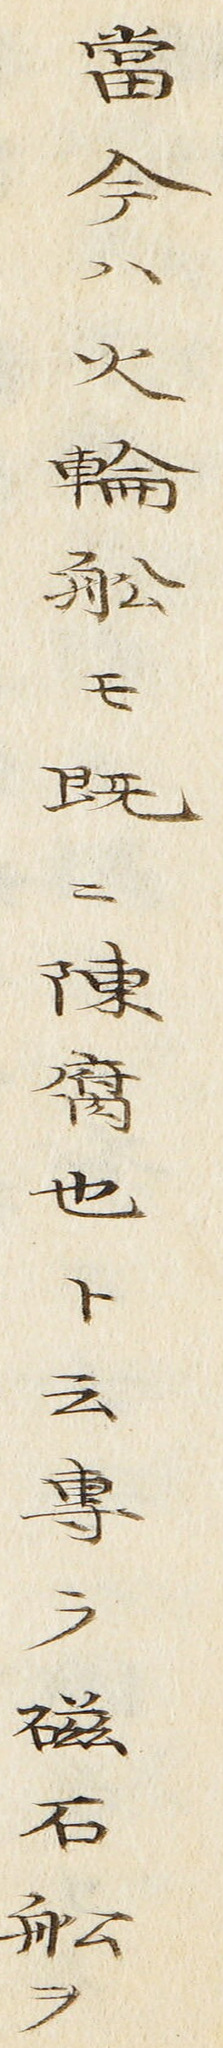○當今ハ火輪舩モ既ニ陳腐也ト云専ラ磁石舩ヲ
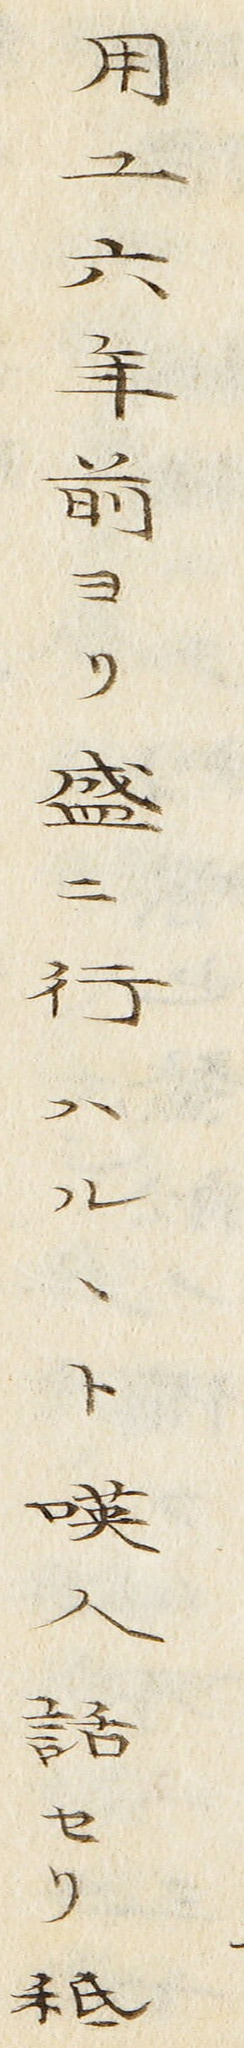用ユ六年前ヨリ盛ニ行ハルヽト人話セリ秪
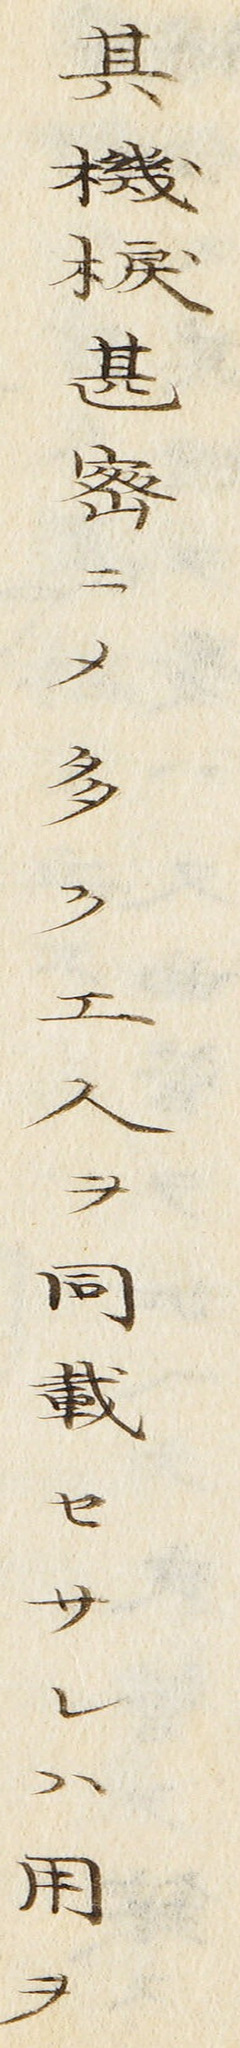其機棙甚密ニシテ多ク工人ヲ同載セサレハ用ヲ
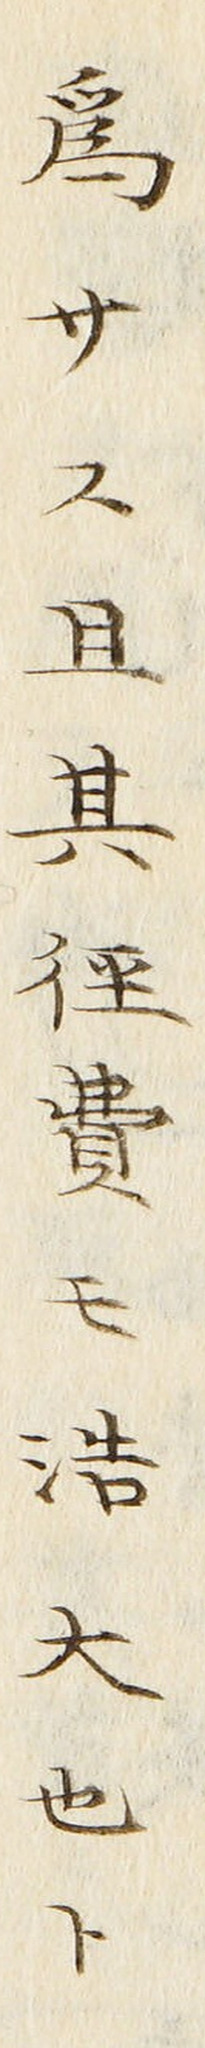為サス且其径費モ浩大也ト
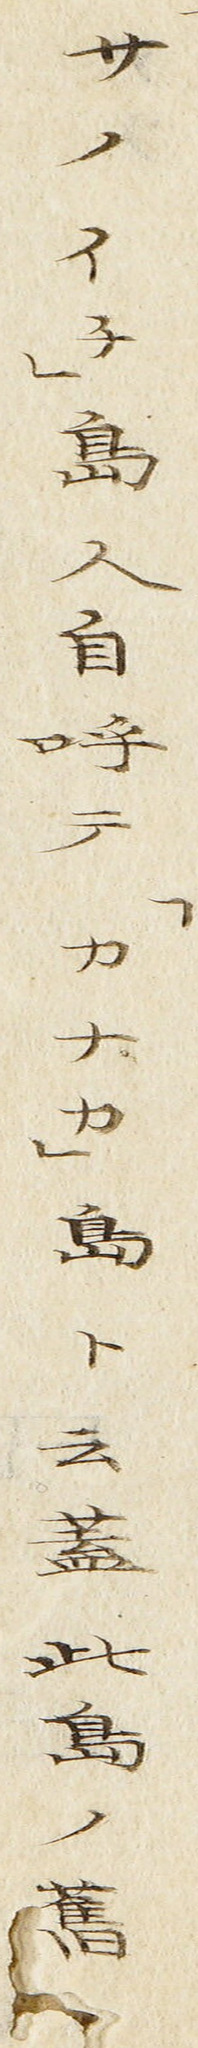〇「サノイチ」島人自呼テ「カトカ」島ト云蓋此島舊
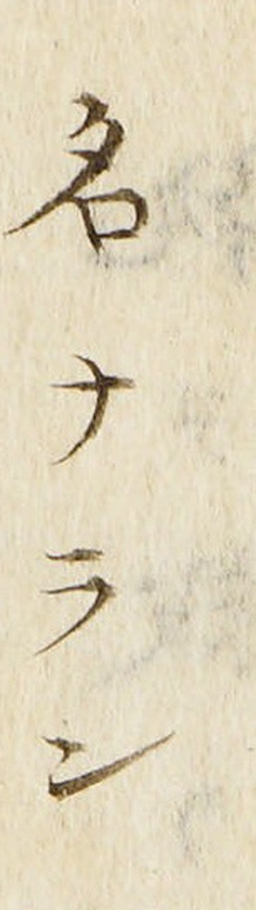名ナラン
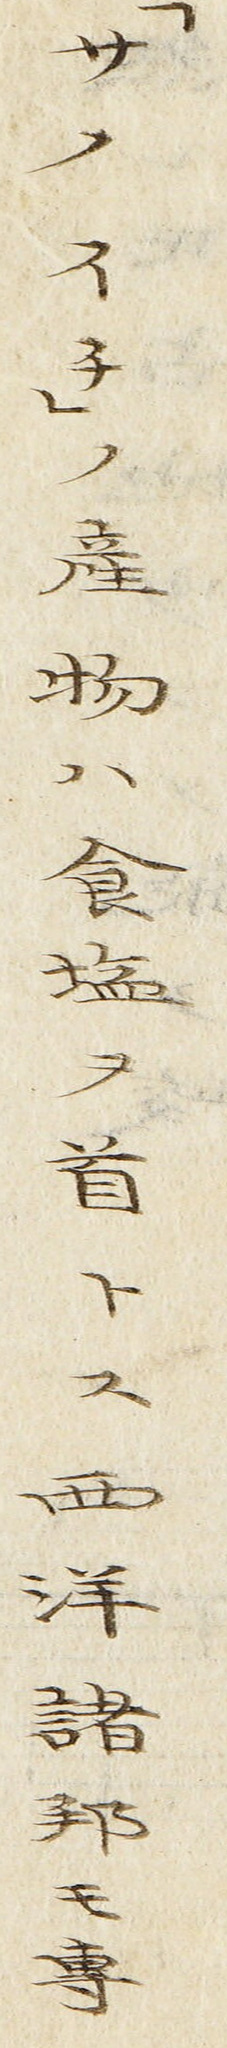〇「サノイチ」ノ産物ハ食塩ヲ首トス西洋諸邦モ専
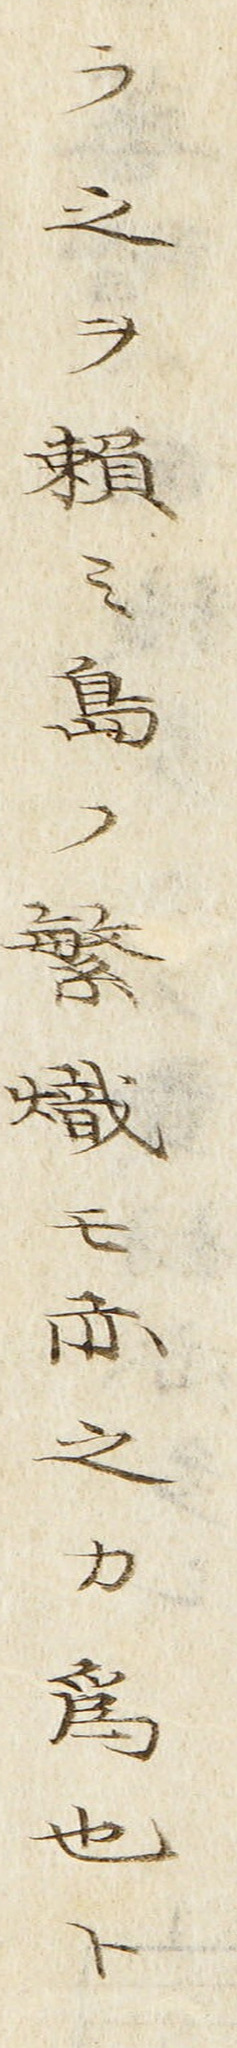ラ之ヲ頼ミ島ノ繁熾ヒ亦之カ為也ト
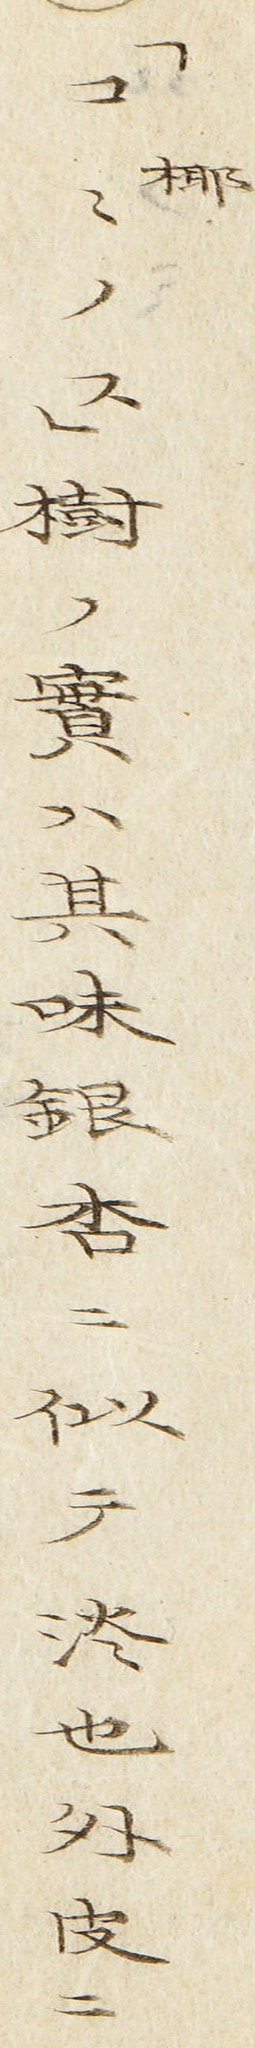〇「コゝノス」樹ノ實ハ其味銀杏ニ似テ淡也外皮ニ
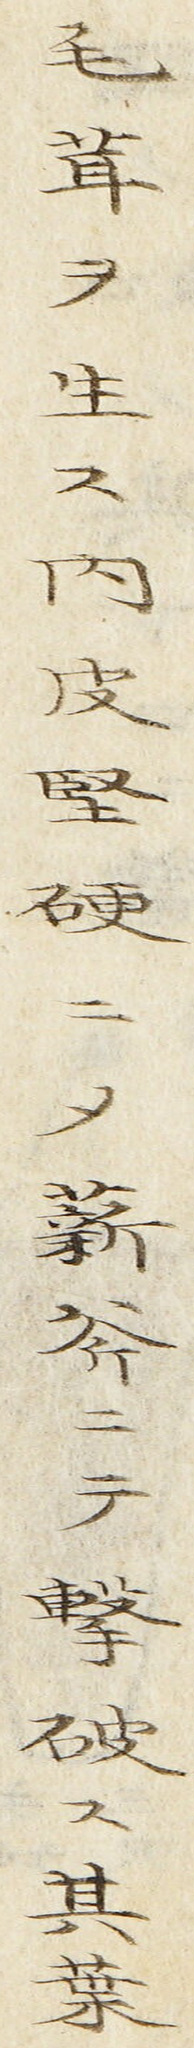毛茸ヲ生ス内皮堅硬ニシテ薪斧ニテ撃破ス其葉
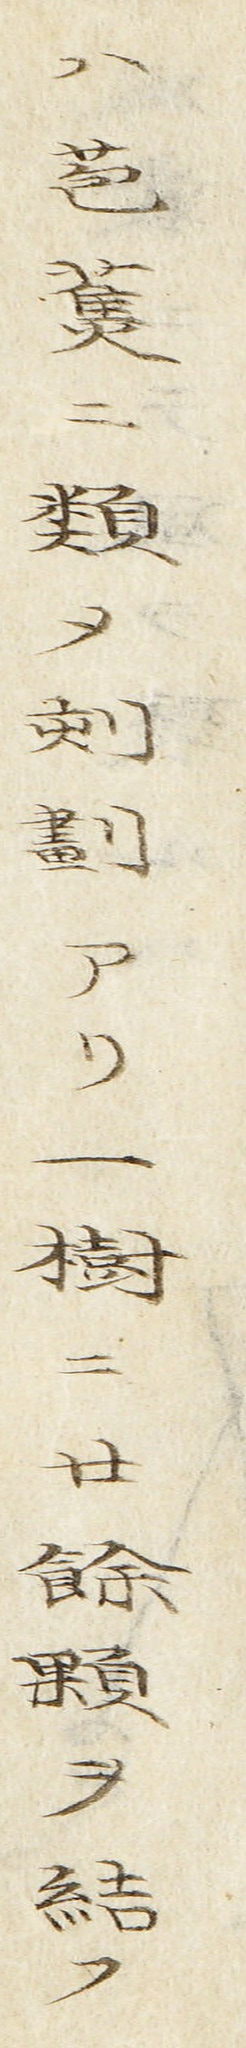ハ芭蕉ニ類シテ刻劃アリ一樹ニ廿餘顆ヲ結フ
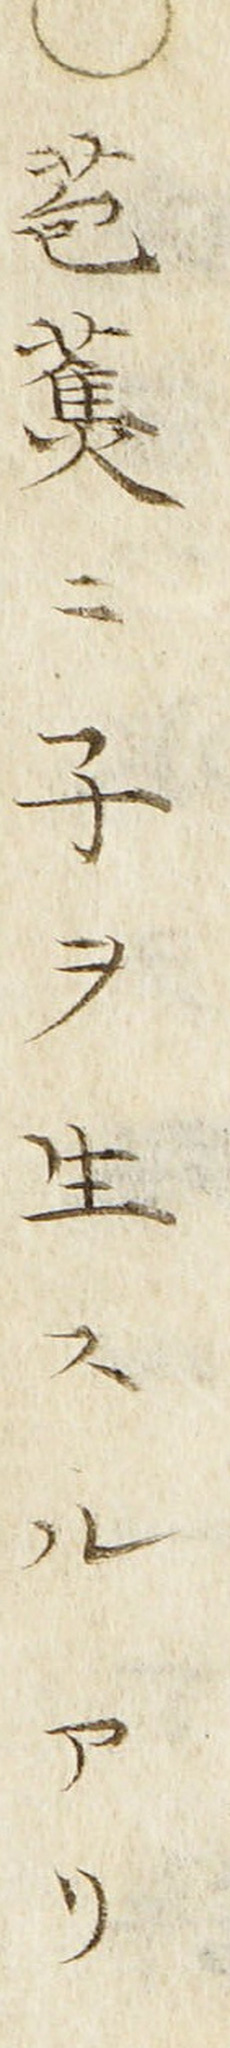○芭蕉ニ子ヲ生スルアリ
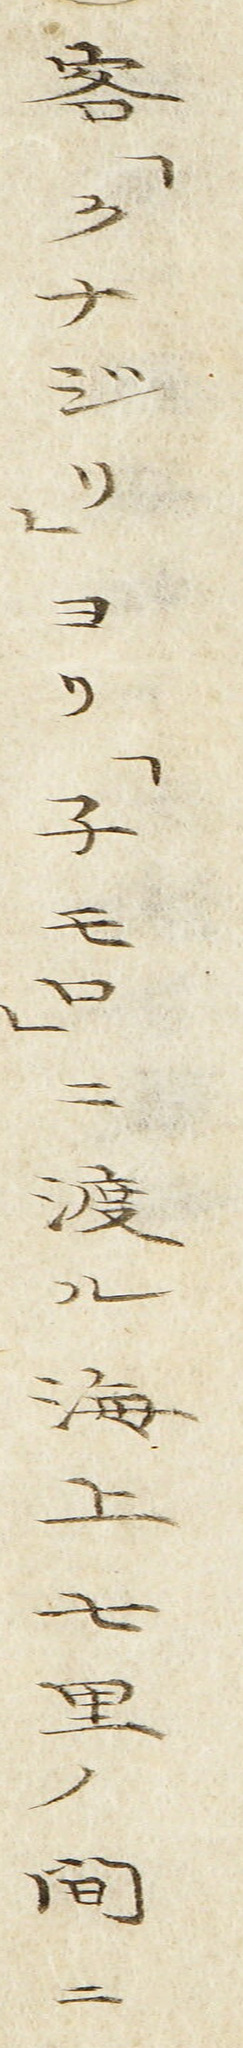○客「クナジリ」ヨリ「ネモロ」ニ渡ル海上七里ノ間ニ
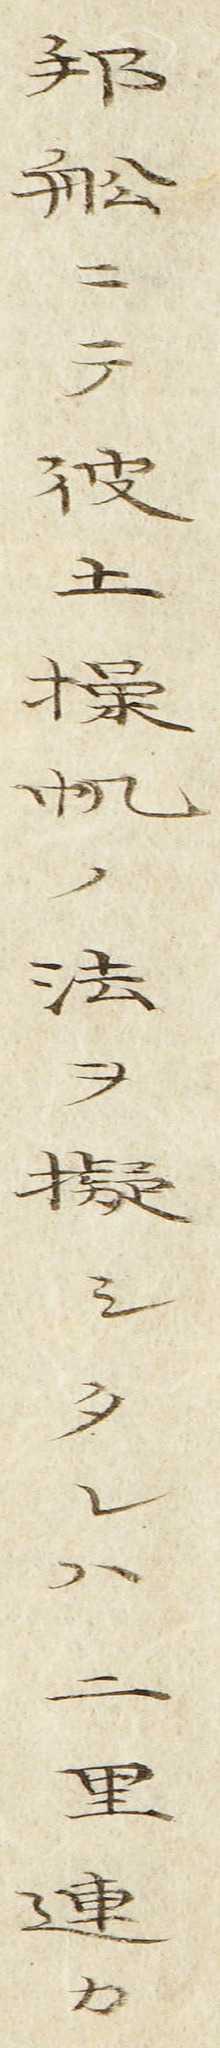邦舩ニテ彼土操帆ノ法ヲ擬シタレハ二里連カ
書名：蕃談
